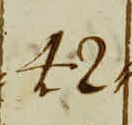42
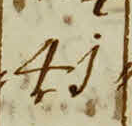41
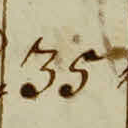35
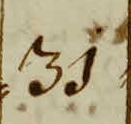31
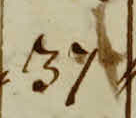37
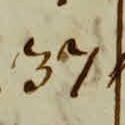37
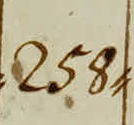258
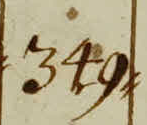349
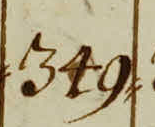349
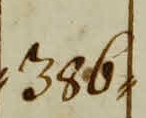386
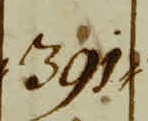391
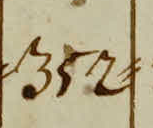352
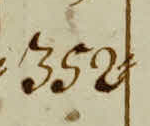352
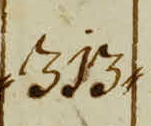313
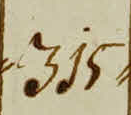315
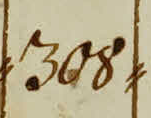308
